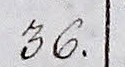36.
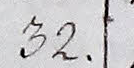32.
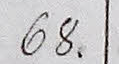68.
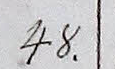48.
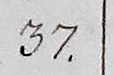37.
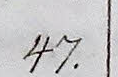47.
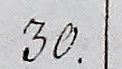30.
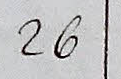26
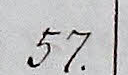57.
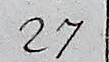27
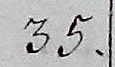35
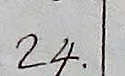24.
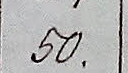50.
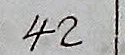42
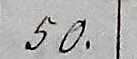50.
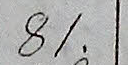81.
